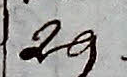29
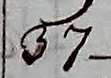37
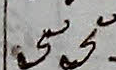55
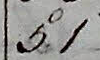51
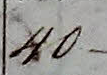40
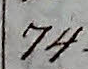74
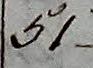51
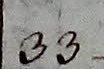33
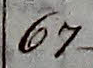67
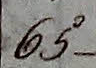65
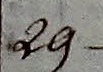29
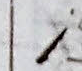1
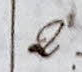2
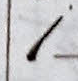1
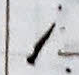1
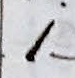1
